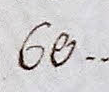60
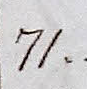71
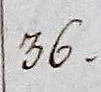36
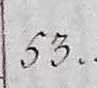53
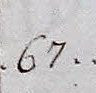67
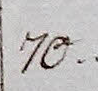70
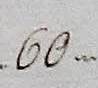60
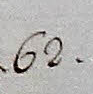62
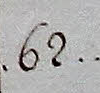62
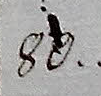80
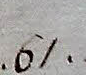61
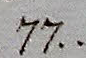77
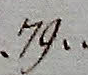79
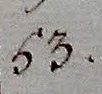53
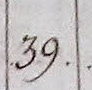39
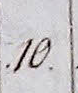10
